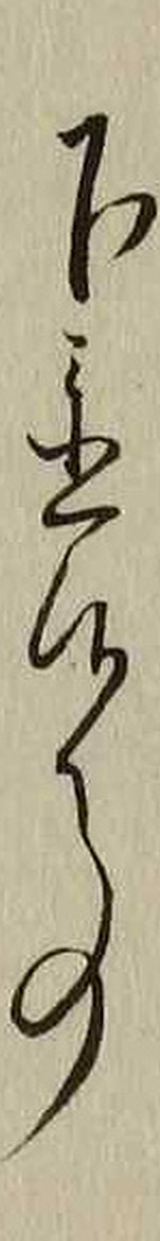下置候事
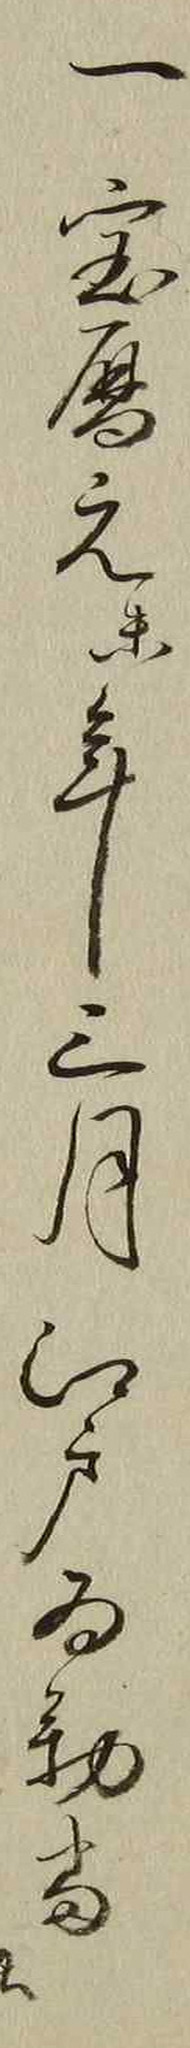一宝暦元未年三月江戸為勤番罷
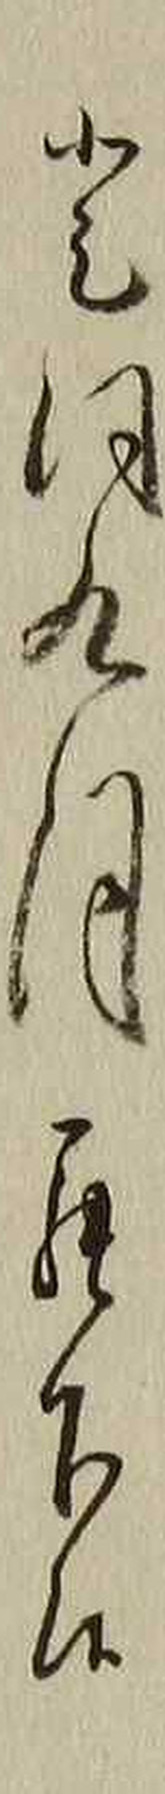登同九月罷下候
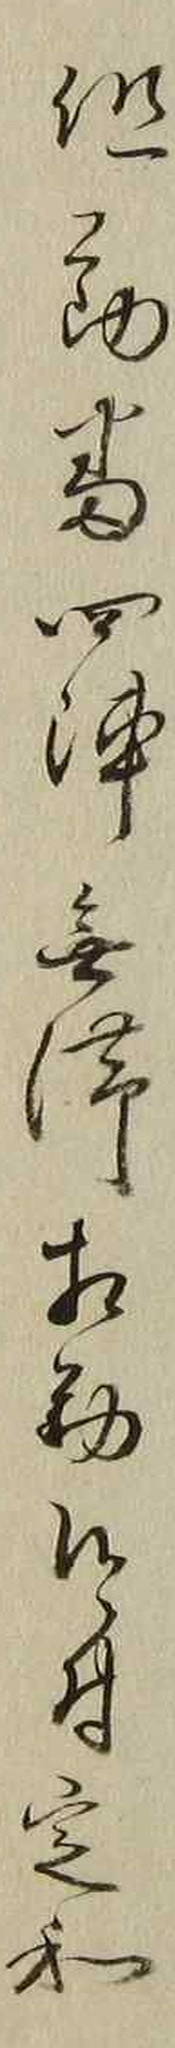但勤番四陣無滞相勤候ニ付定和
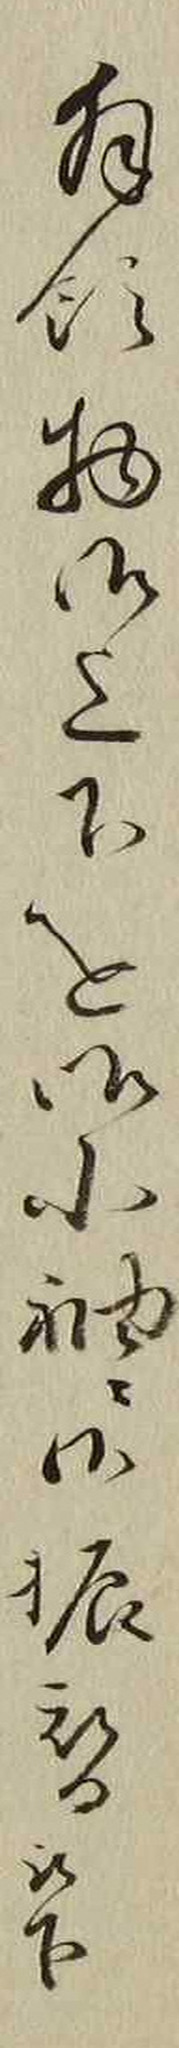拝領物御上下を御小袖ニ御振替被下
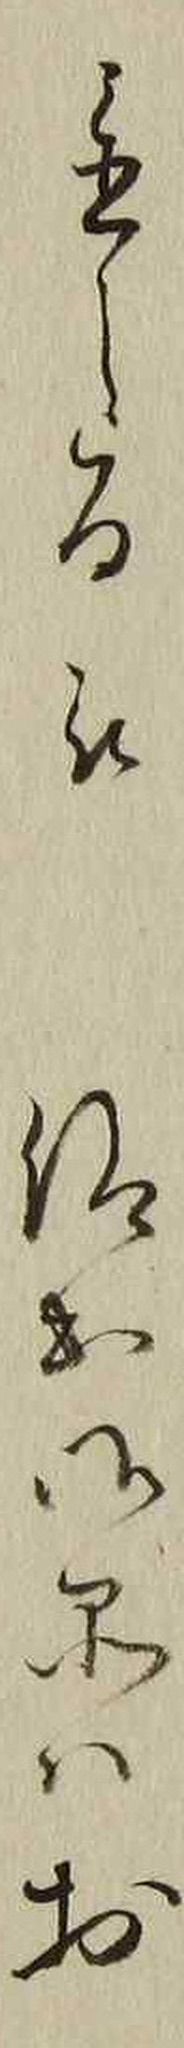置之旨被仰出御品ハ於
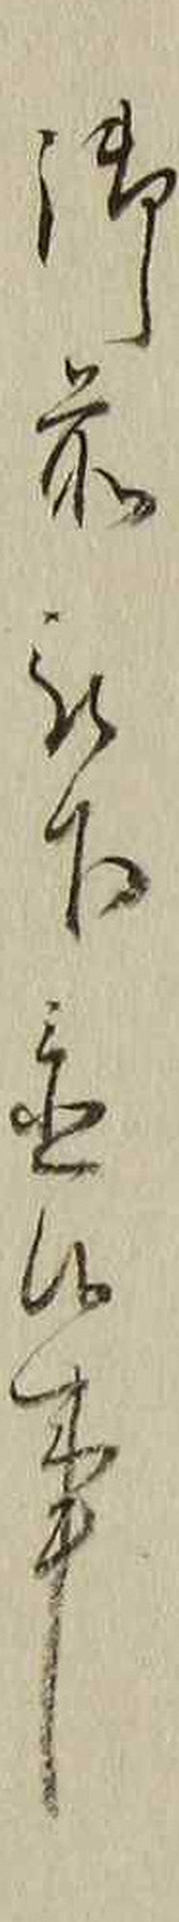御前被下置候事
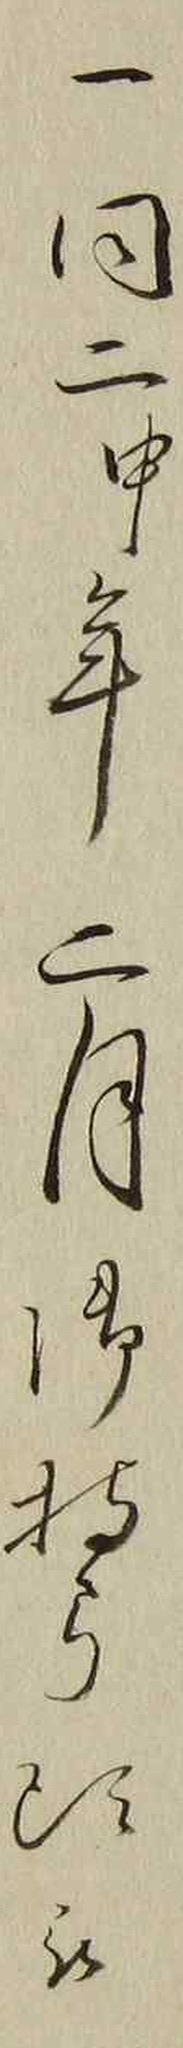一同二申年二月御持弓頭被
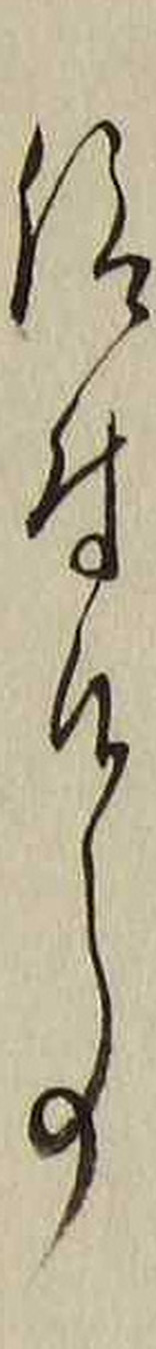仰付候事
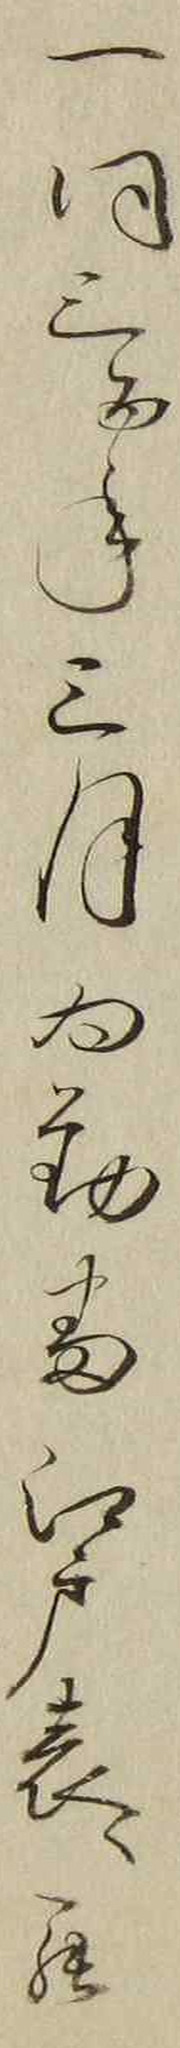一同三酉年三月為勤番江戸表へ罷

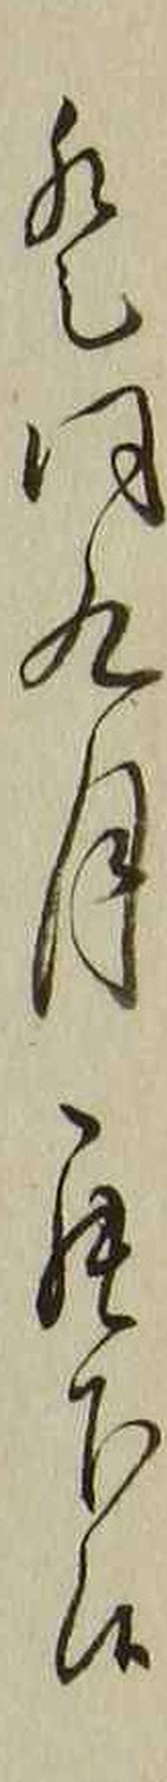登同九月罷下候
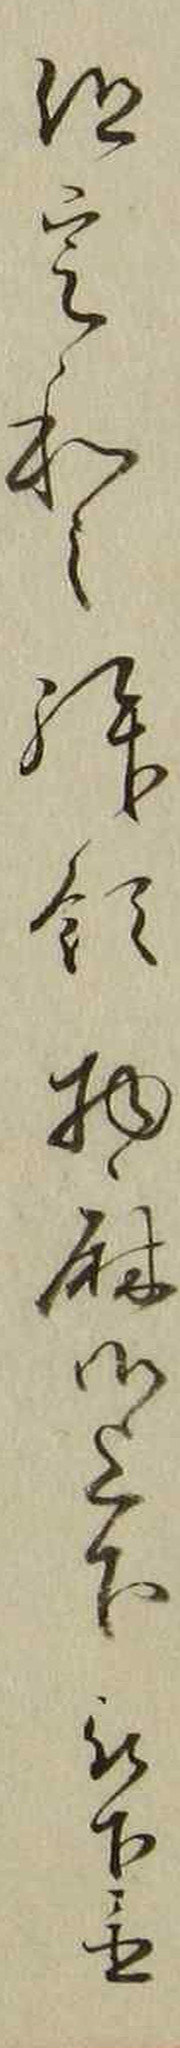但定和之拝領物麻御上下被下置
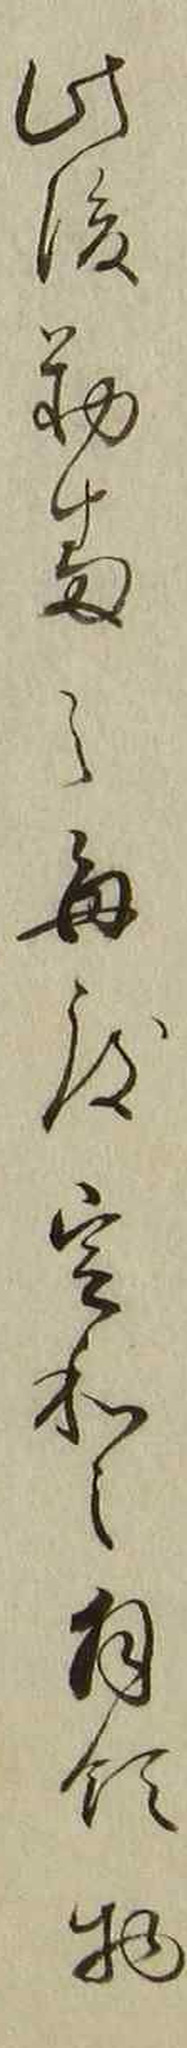以後勤番之毎度定和之拝領物
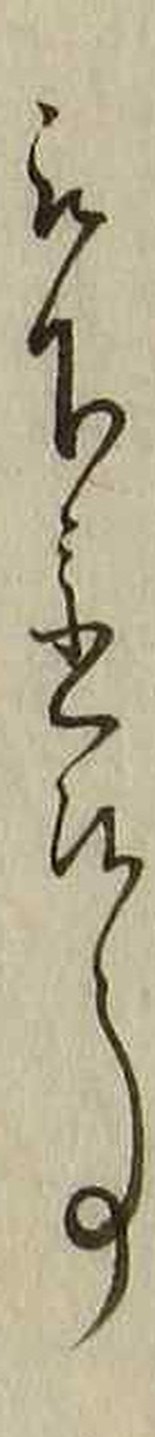被下置候事
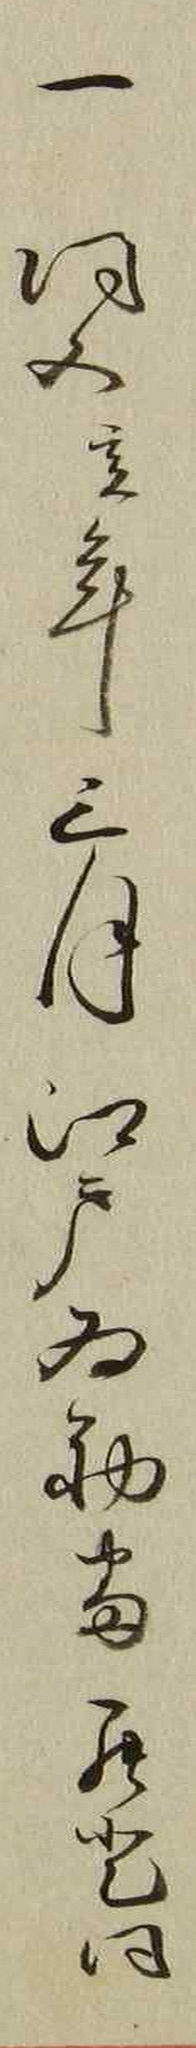一同五亥年三月江戸為勤番罷登同
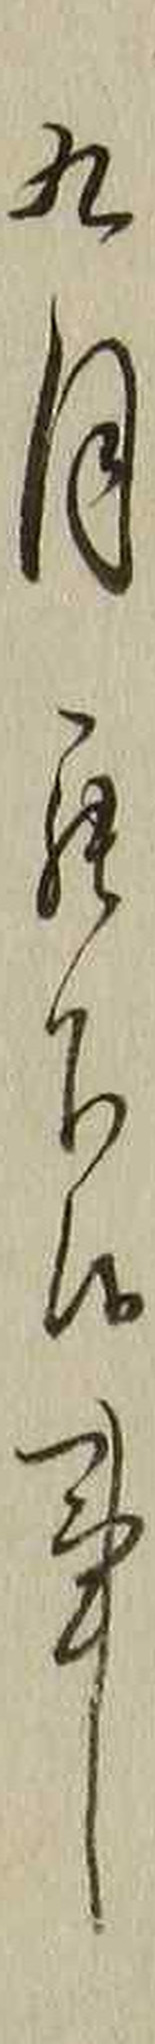九月罷下候事
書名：諸士系譜　巻之2　い之部2
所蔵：会津若松市立会津図書館
